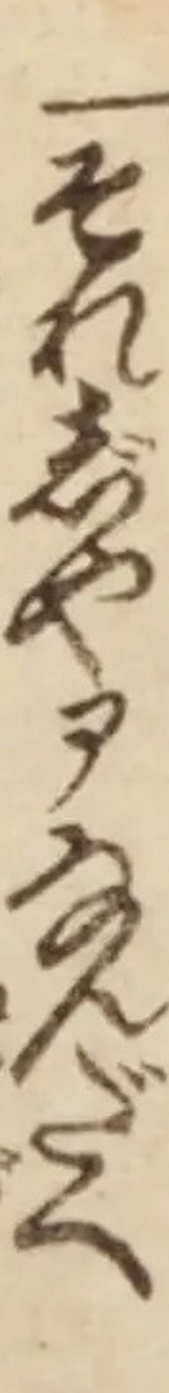〽それじやアなんだへ
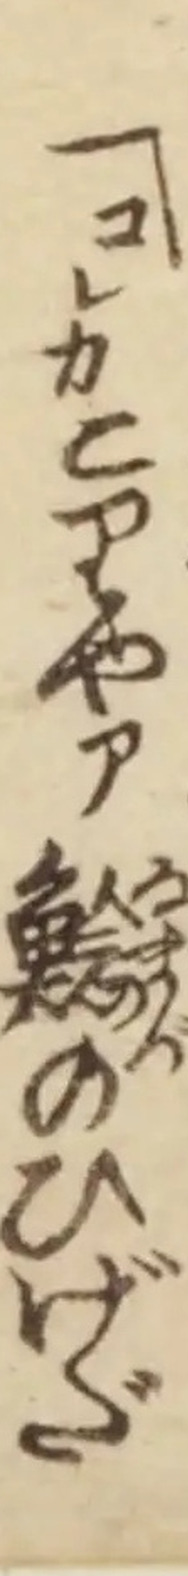〽コレカこりやア鯰のひげだ
